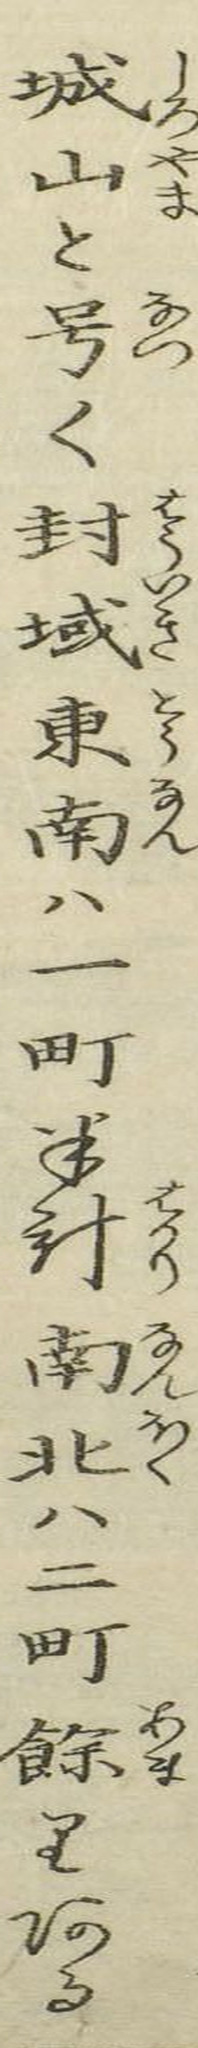城山と号く封域東南は一町半計南北は二町餘りある

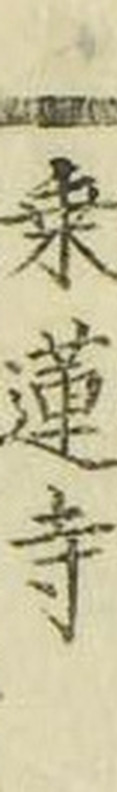乗蓮寺
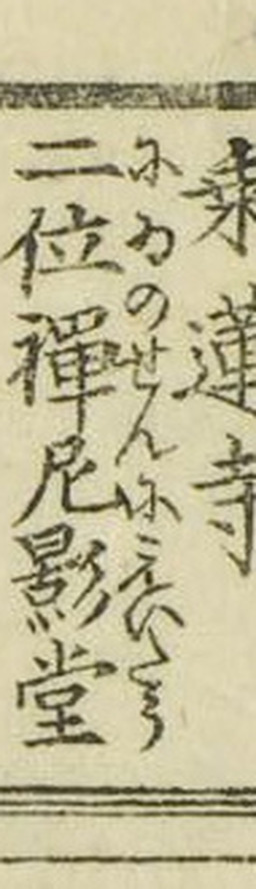二位禪尼影堂
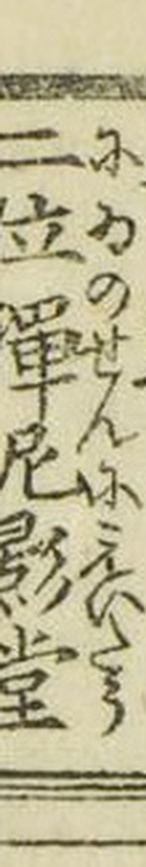二位禅尼影堂
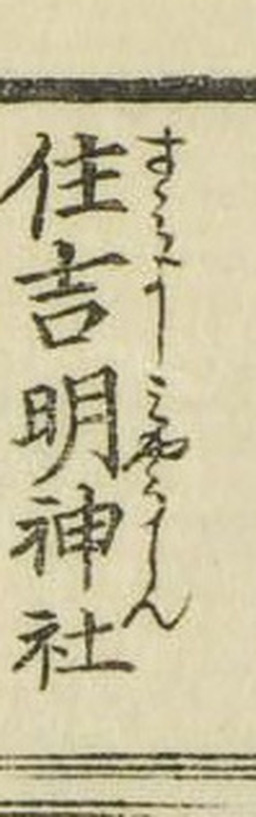住吉明神社

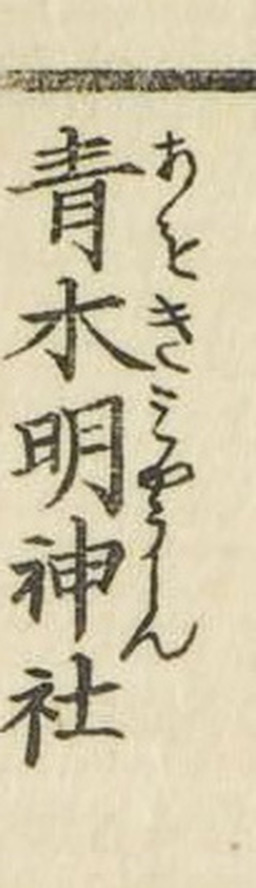青木明神社
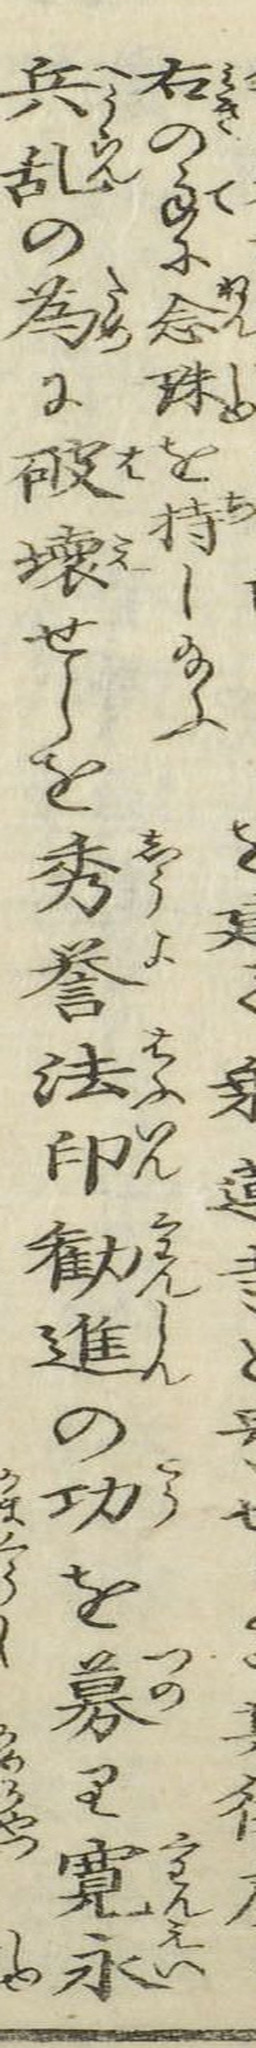兵乱の為に破壊せしを秀誉法印勧進の功を募り寛永
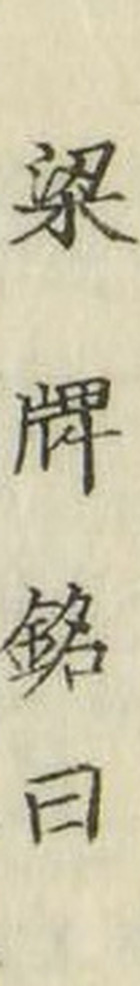梁牌銘曰
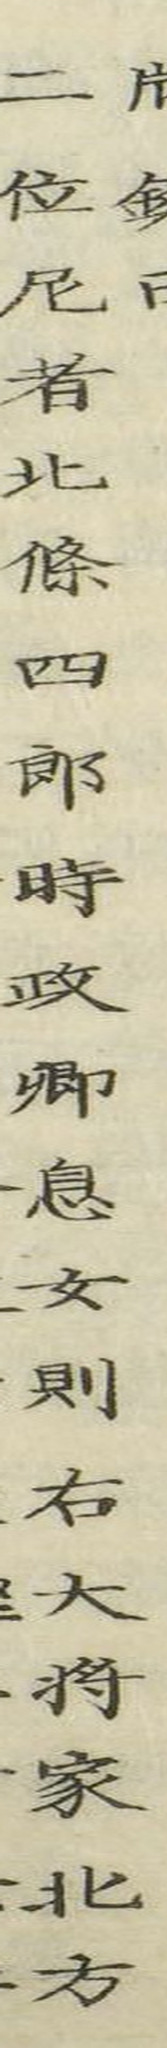二位尼者北條四郎時政卿息女則右大将家北方
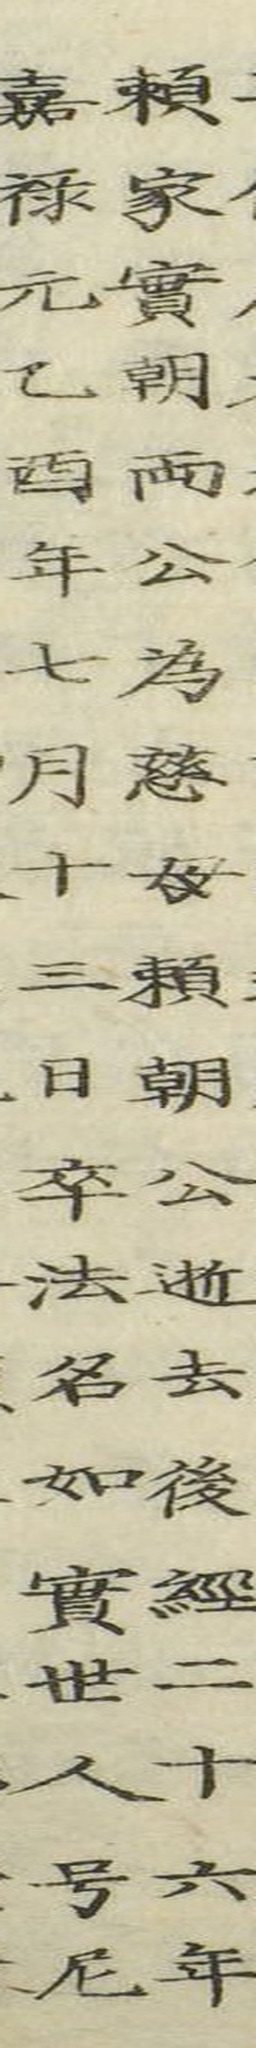嘉禄元乙酉年七月十三日卒法名如實世人号尼
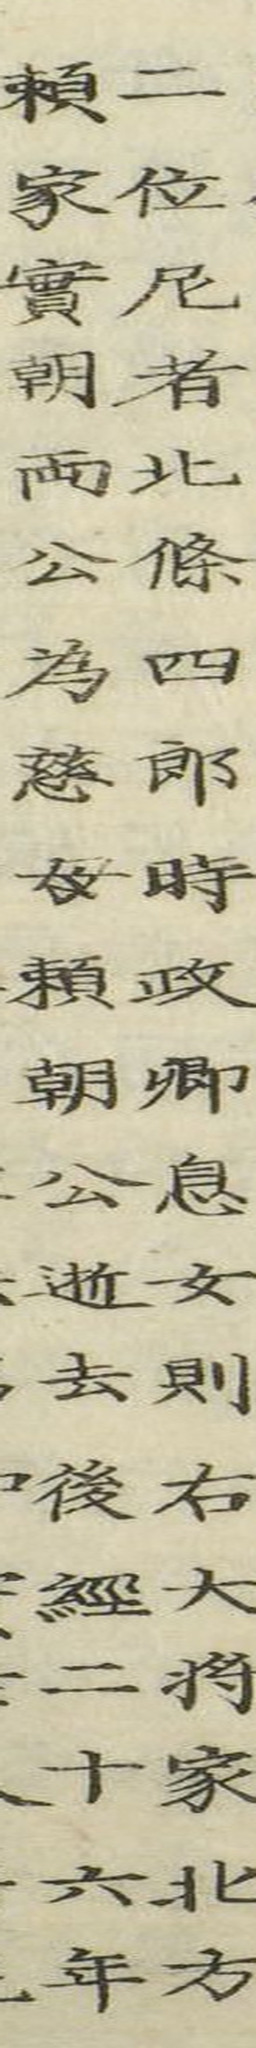頼家實朝両公為慈母頼朝公逝去後經二十六年
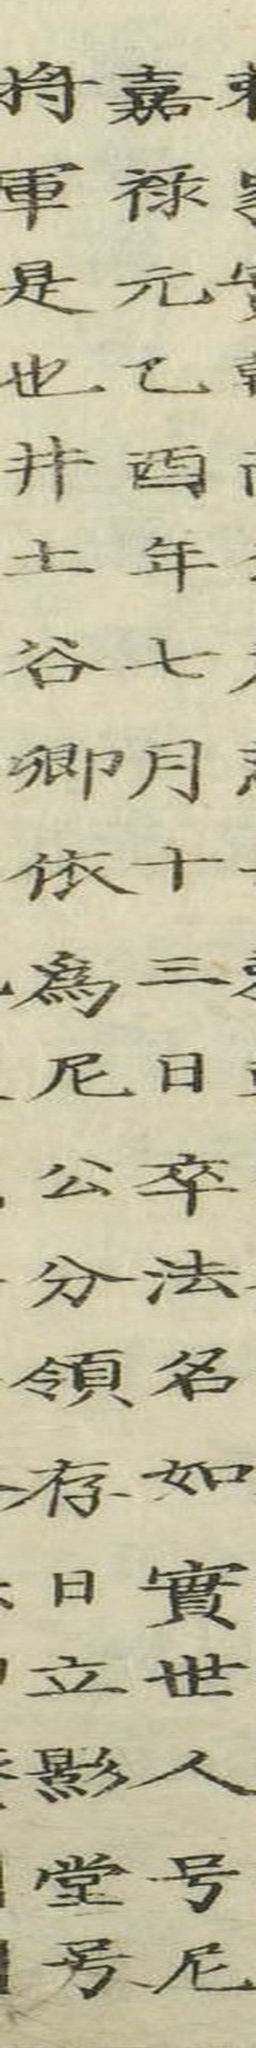將軍是也井土谷卿依為尼公分領存日立影堂号
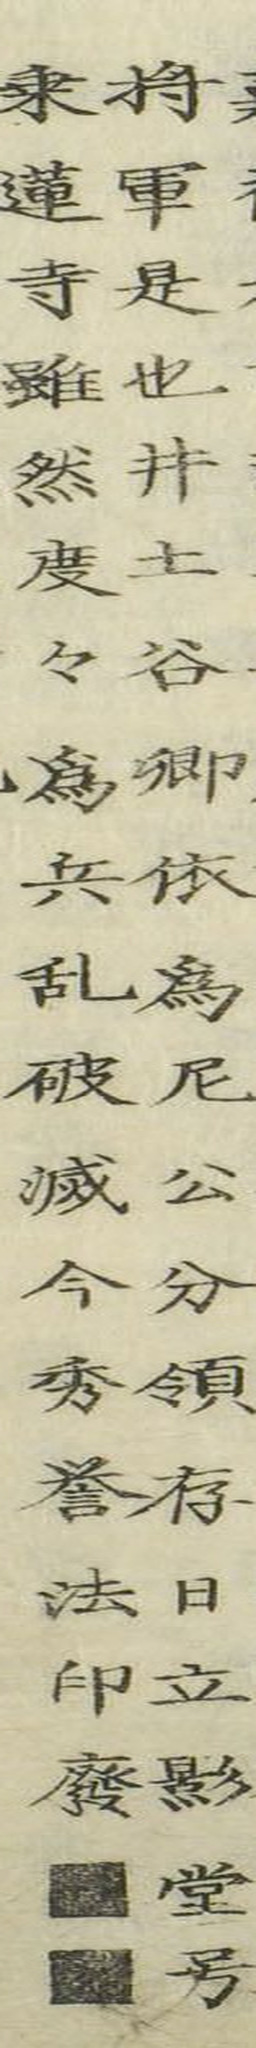乗蓮寺雖然度々爲兵乱破滅今秀誉法印廢
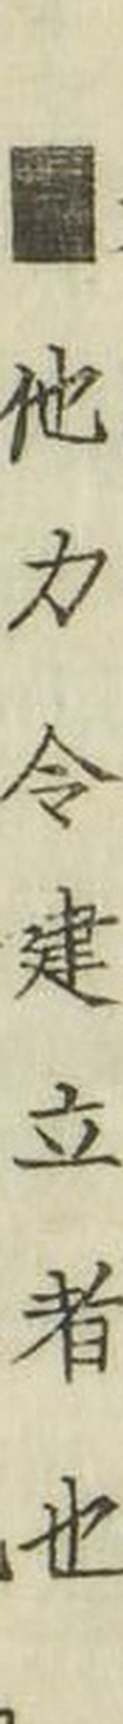他力令建立者也
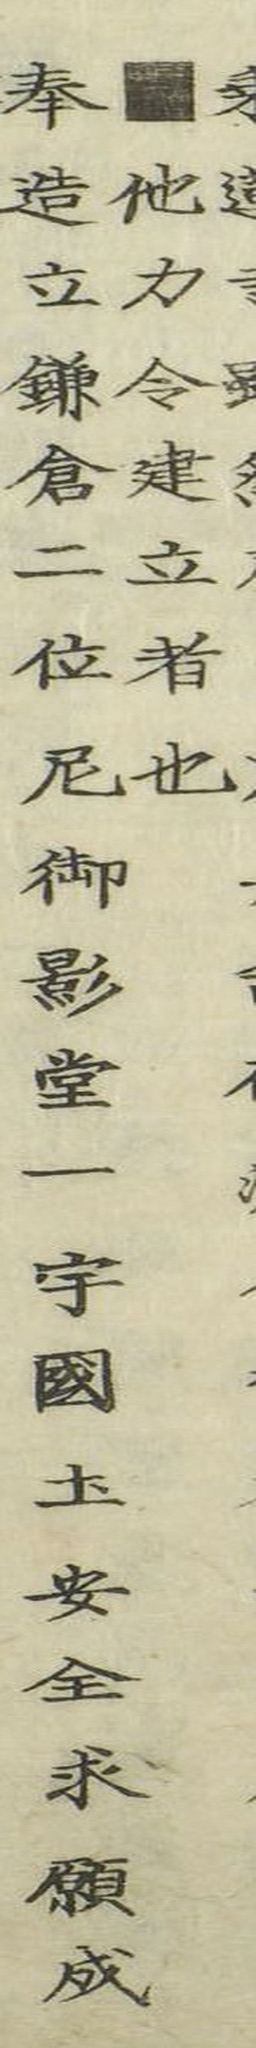奉造立鎌倉二位尼御影堂一宇國𡈽安全求願成

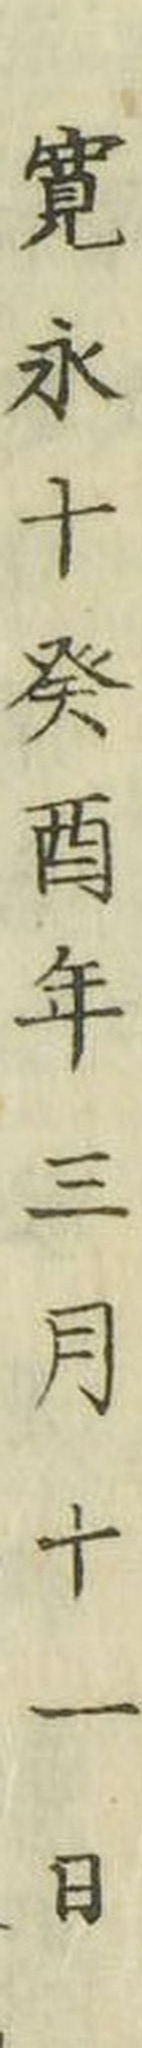寛永十癸酉年三月十一日
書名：江戸名所図会 20巻 巻之6
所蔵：東京学芸大学教育コンテンツアーカイブ
